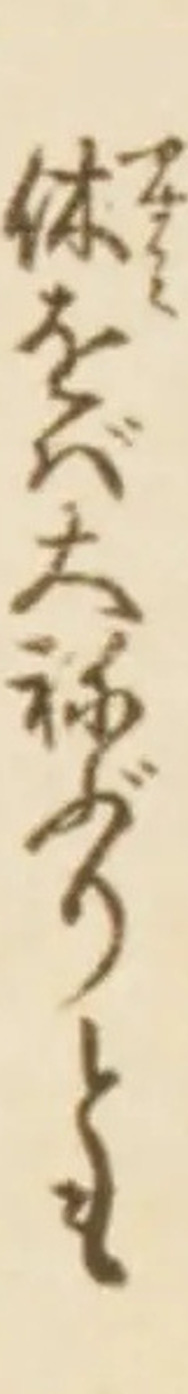休をば大ねぶりとも
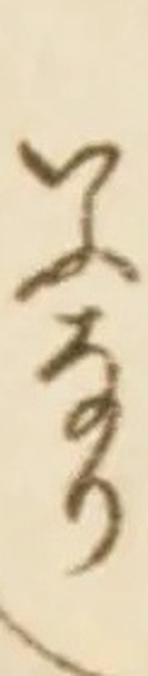いふなり
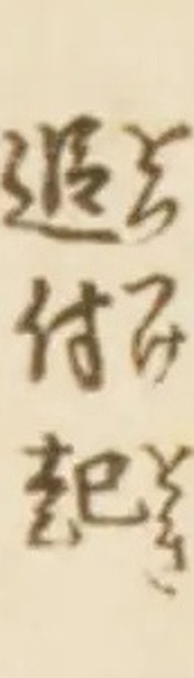追付起
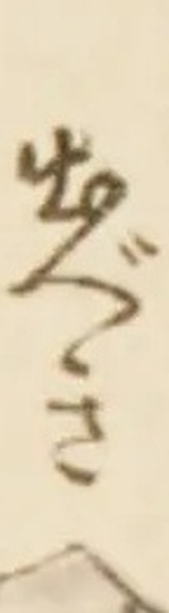出べき
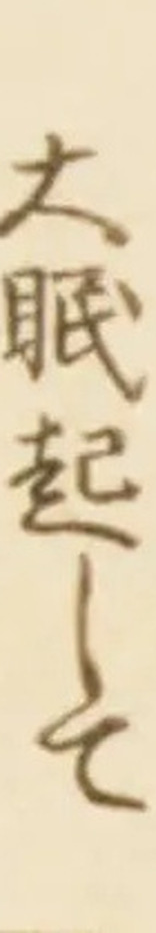大眠起して
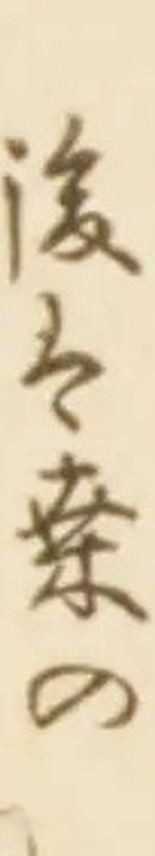後は桑の
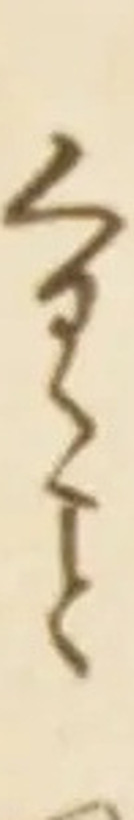くるゝこと
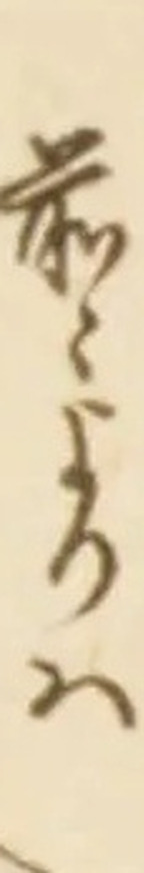前々よりは
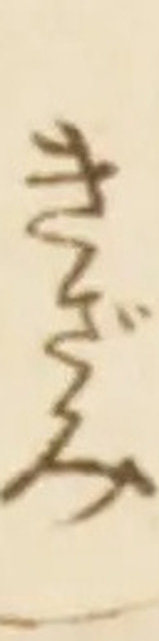きざみ
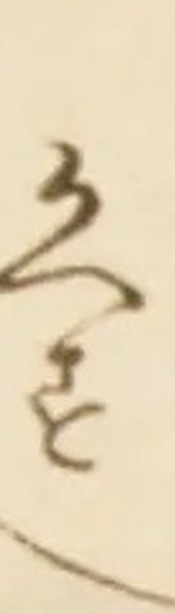かへす
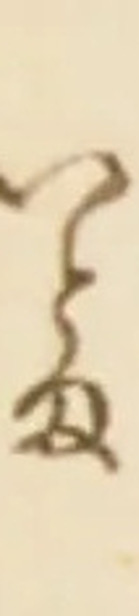いとま
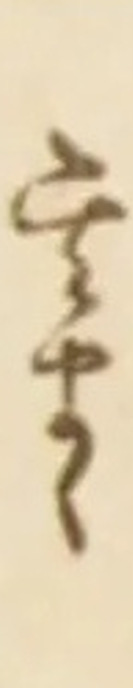其まゝ
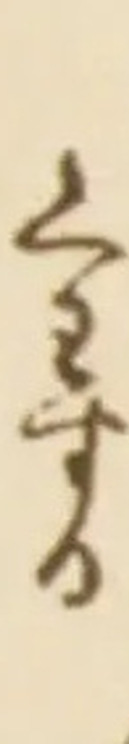くわする
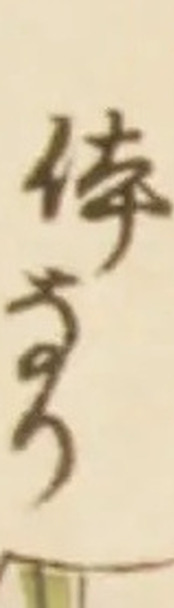体なり

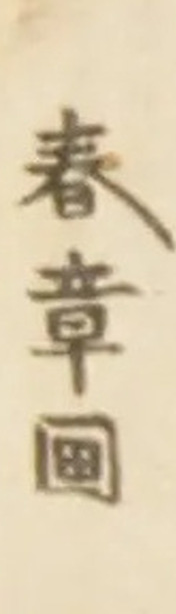春章画
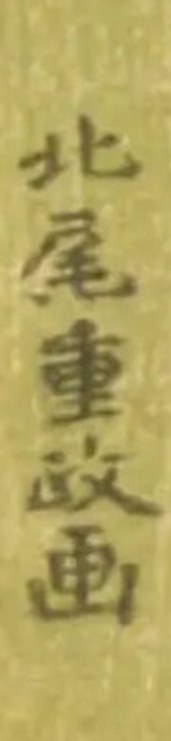北尾重政画
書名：画本宝能縷
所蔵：国立国会図書館 National Diet Library, JAPAN
